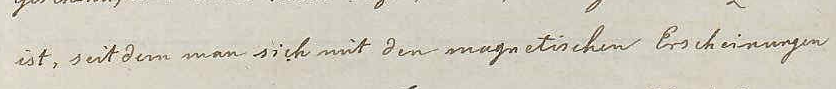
ist, seitdem man sich mit den magnetischen Erscheinungen
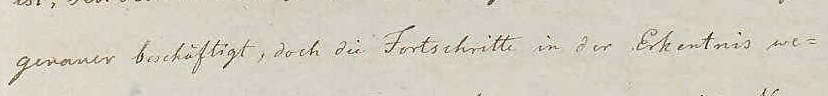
genauer beschäftigt, doch die Fortschritte in der Erkentnis we-
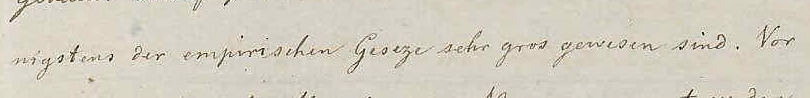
nigstens der empirischen Geseze sehr gros gewesen sind. Vor
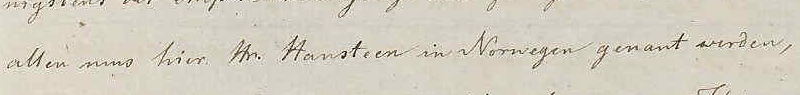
allen mus hier Hr. Hansteen in Norwegen genant werden,
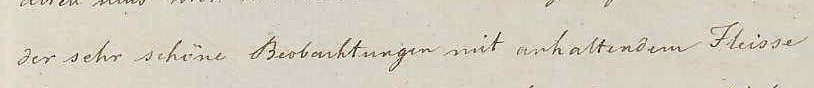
der sehr schöne Beobachtungen mit anhaltendem Fleisse
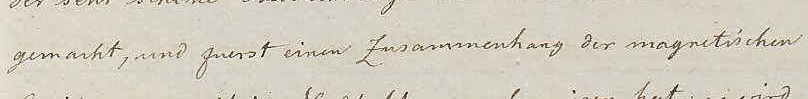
gemacht, und zuerst einen Zusammenhang der magnetischen
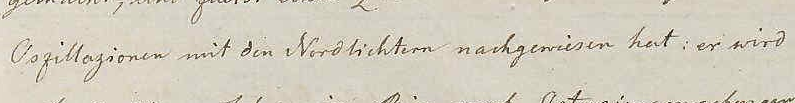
Oszillazionen mit den Nordlichtern nachgewiesen hat: er wird
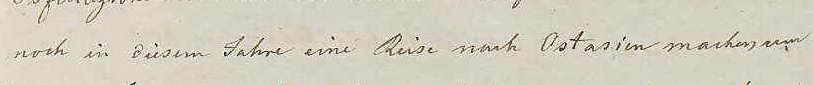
noch in diesem Jahre eine Reise nach Ostasien machen, um
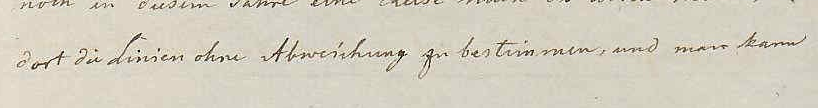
dort die Linien ohne Abweichung zu bestimmen, und man kann
